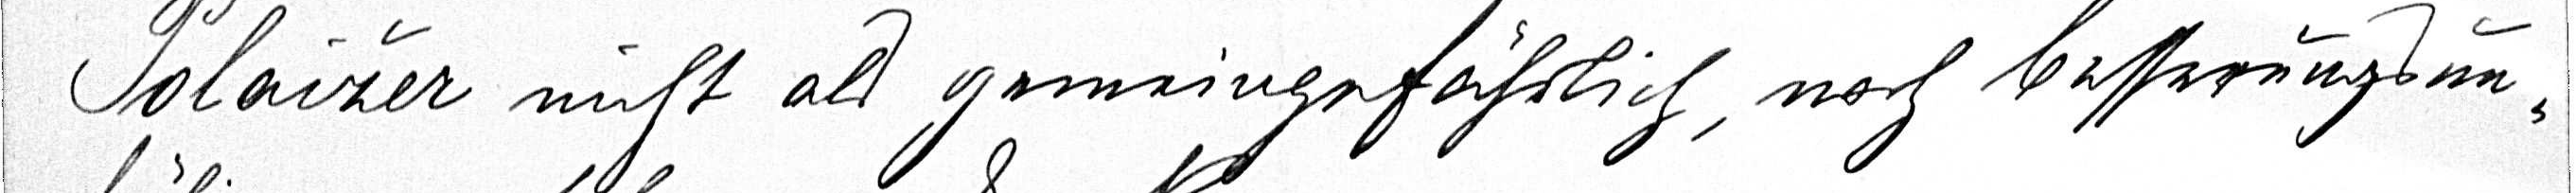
Polaižer nicht als gemeingefährlich, noch besserungsun¬
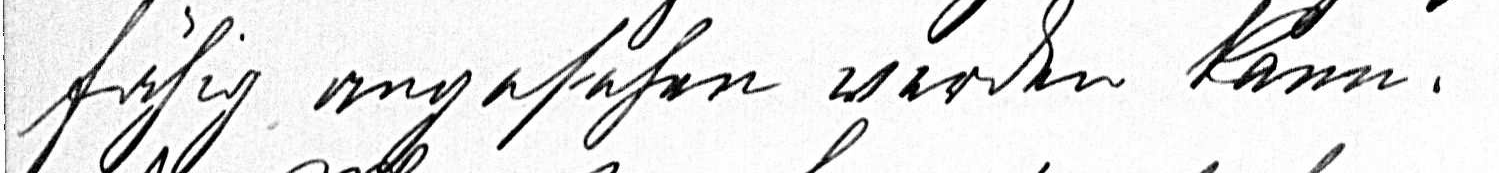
fähig angesehen werden kann.
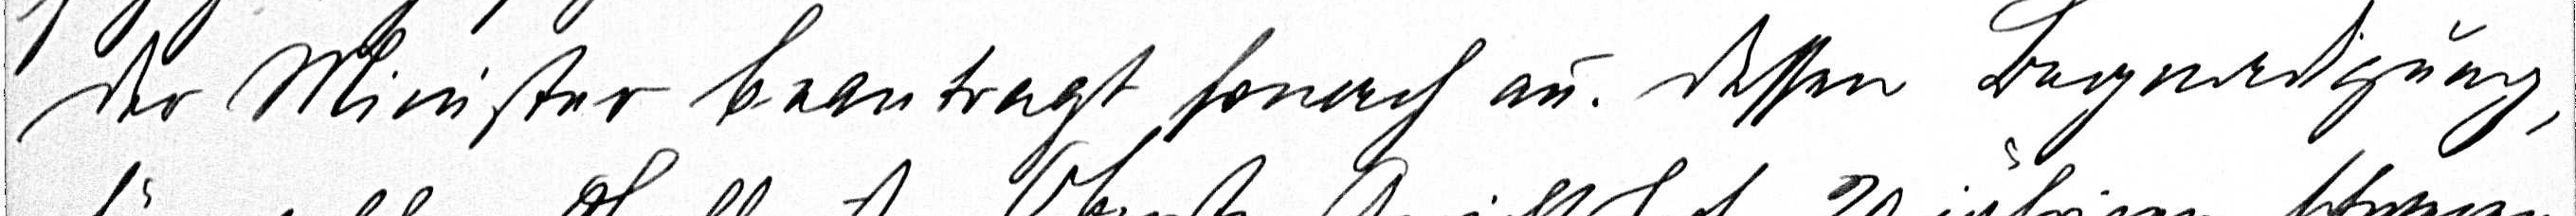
Der Minister beantragt sonach au. dessen Begnadigung,
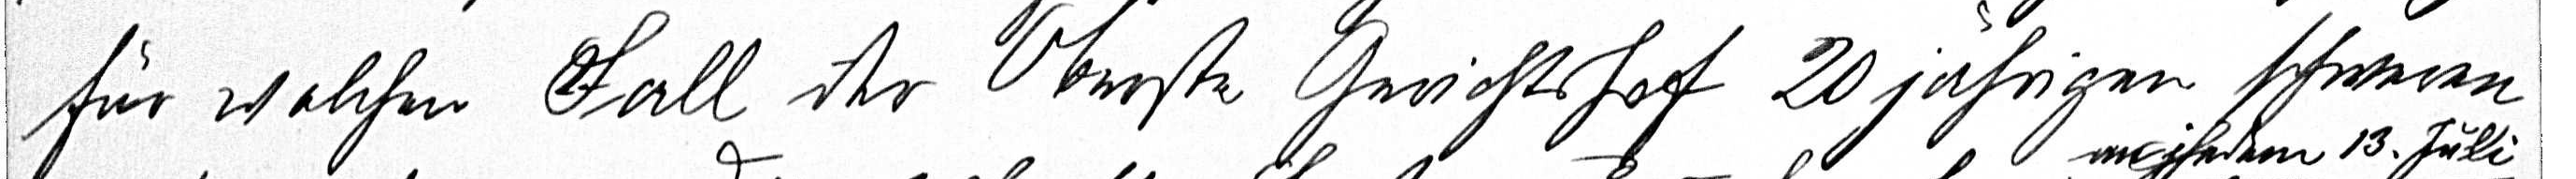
für welchen Fall der Oberste Gerichtshof 20jährigen schweren
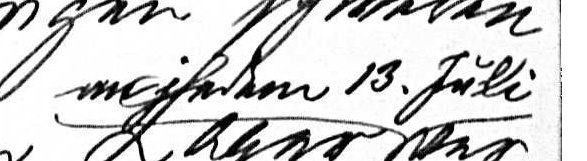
jeden 13. Juli
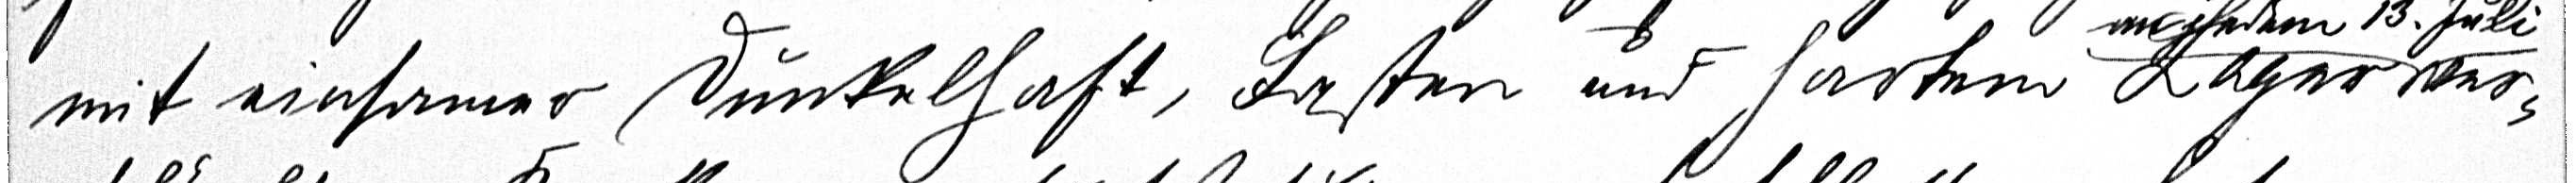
mit einsamer Dunkelhaft, Fasten und hartem Lager am ver¬
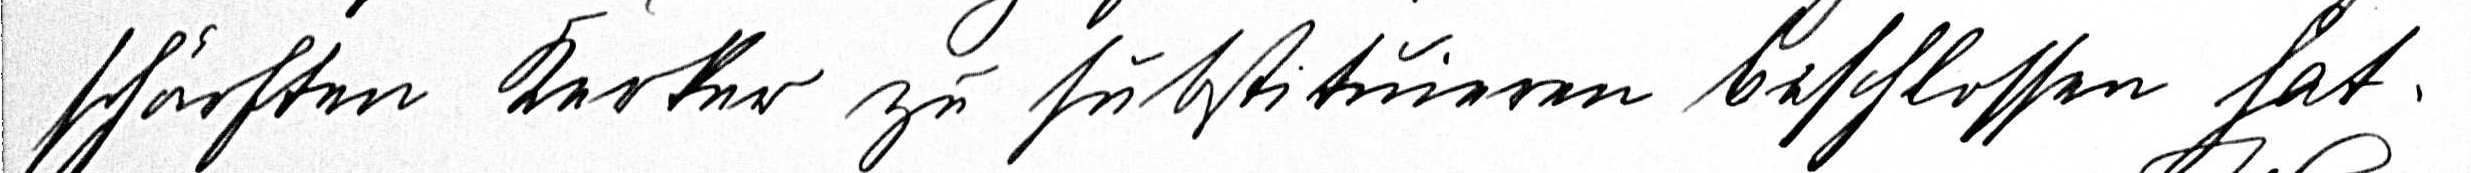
schärften Kerker zu substituieren beschlossen hat.
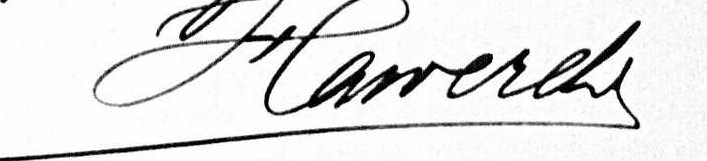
Hawerda
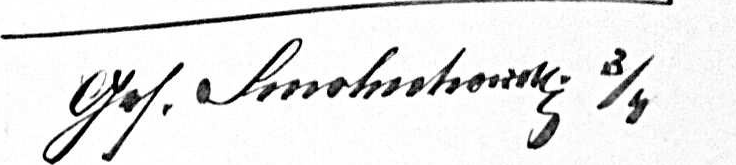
Ges. Smoluchowski 3/4
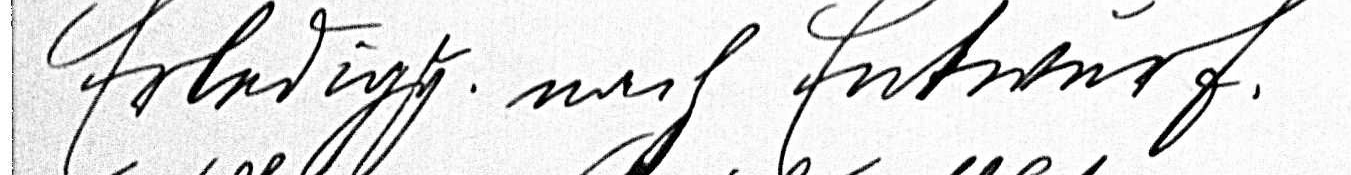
Erledigung nach Entwurf
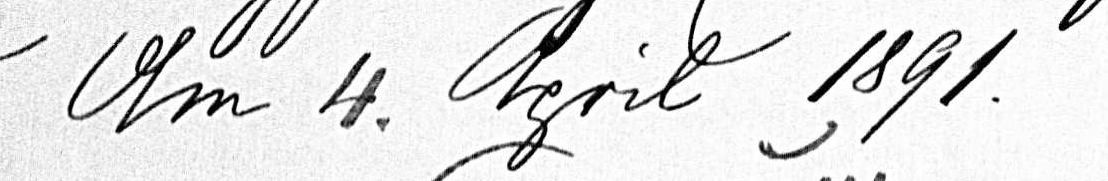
Am 4. April 1891
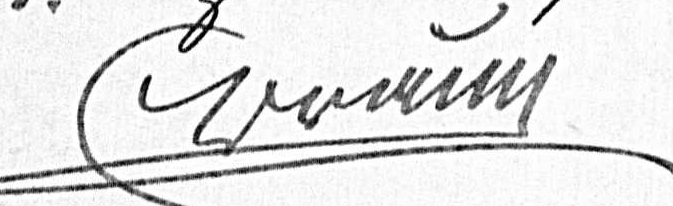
Braun
